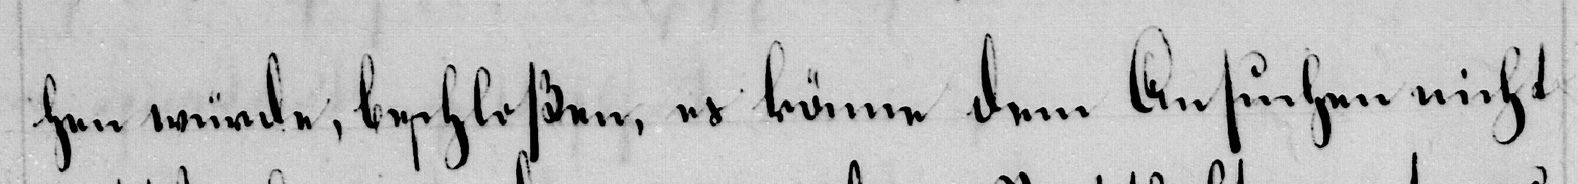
hen würde, beschloßen, es könne dem Ansuchen nicht
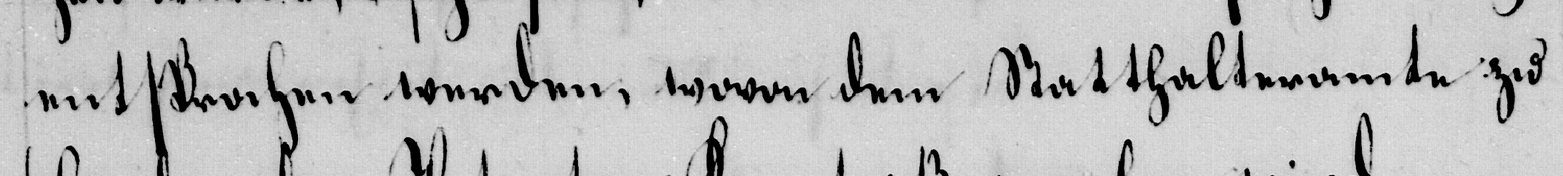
entsprochen werden, wovon dem Statthalteramte zu
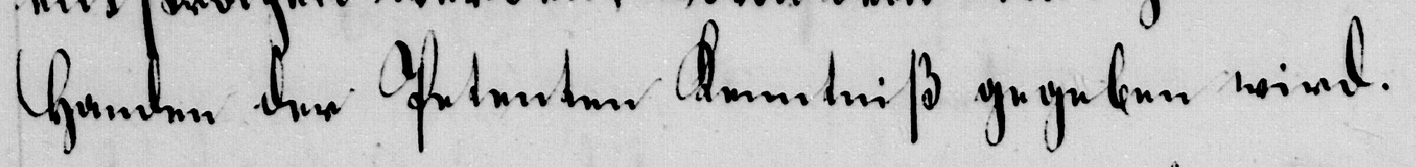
Handen der Petenten Kenntniß gegeben wird.
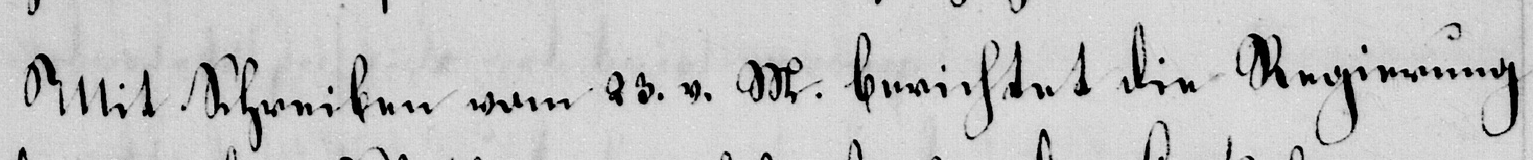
Mit Schreiben vom 23. v. M. berichtet die Regierung
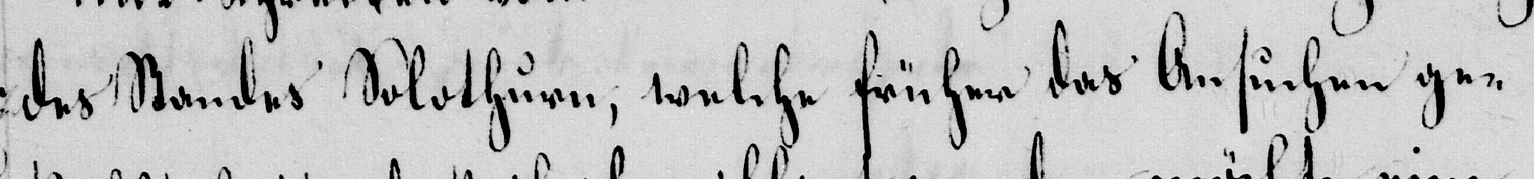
des Standes Solothurn, welche früher das Ansuchen ge¬
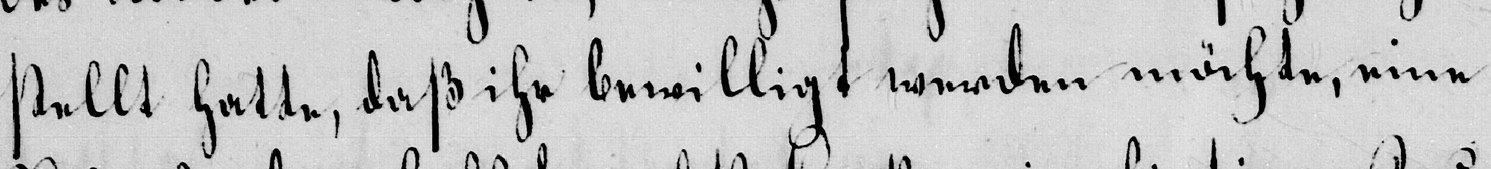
stellt hatte, daß ihr bewilligt werden möchte, eine
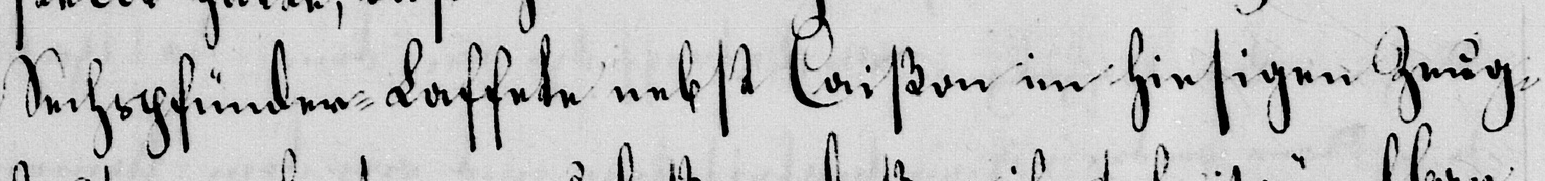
Sechspfünder-Laffete nebst Caißen im hiesigen Zeug¬
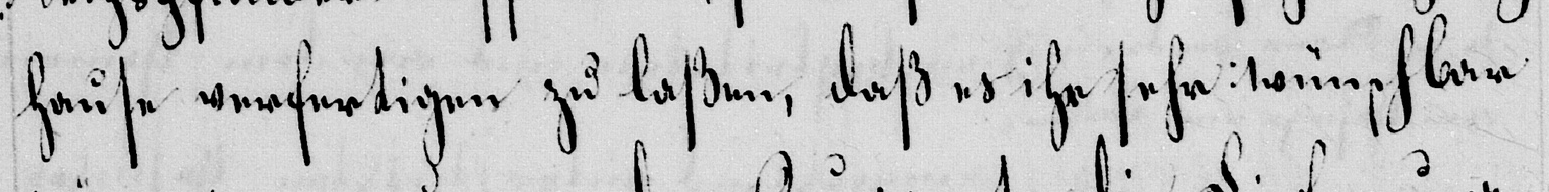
hause verfertigen zu laßen, daß es ihr sehr wünschbar
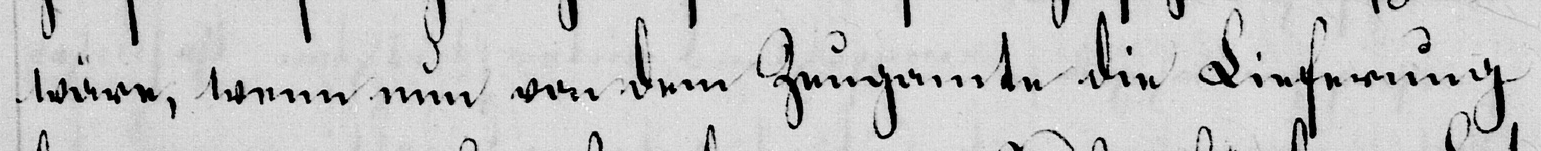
wäre, wenn nun von dem Zeugamte die Lieferung
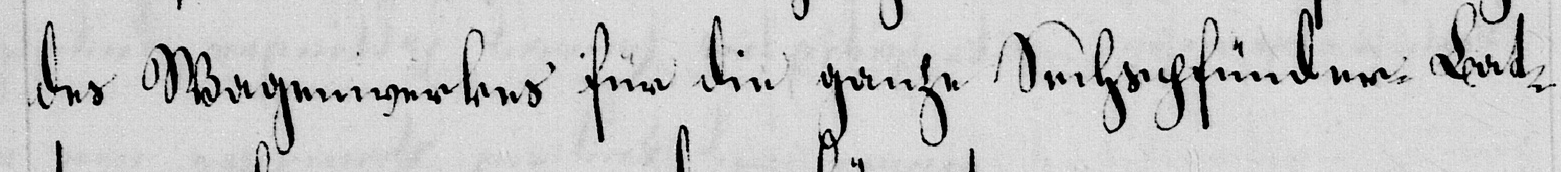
des Wagenwerkes für die ganze Sechspfünder-Bat¬
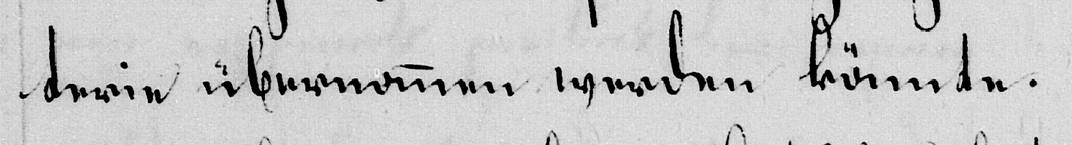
terie übernommen werden könnte.
